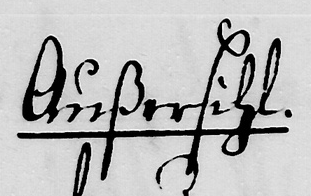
Außersihl.
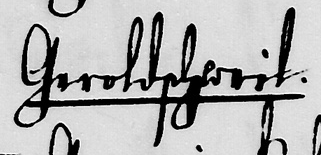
Geroldschwei¬
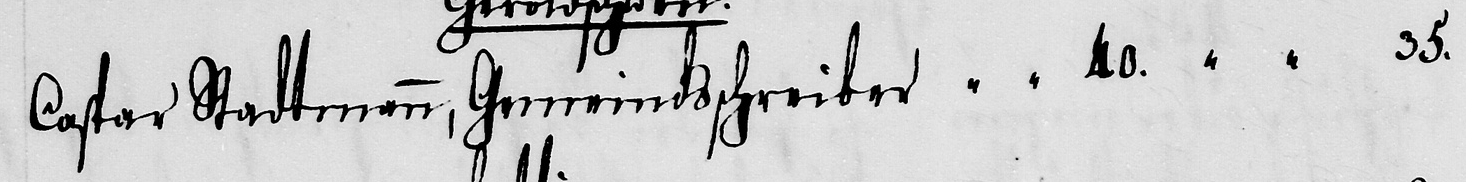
Caspar Stadtmann, Gemeindschreiber “ 40. “ 35.
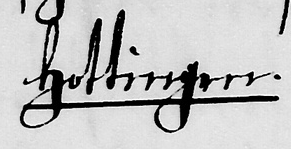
Hottingen.
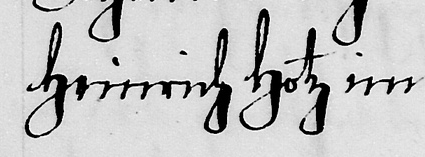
Heinrich Hotz im
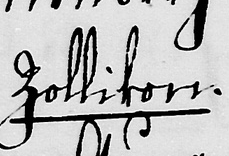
ollikon.
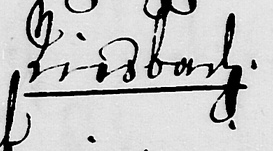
Riesbach.
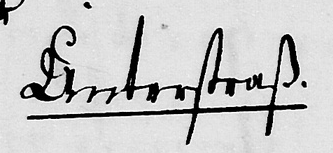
Unterstraß.
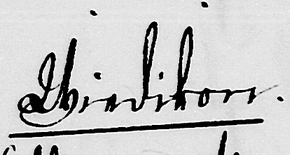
Wiedikon.
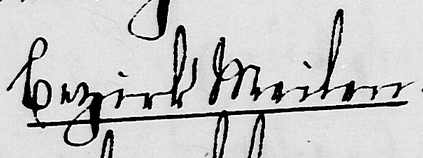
Bezirk Meilen.
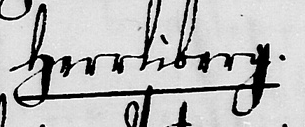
Herrliberg.
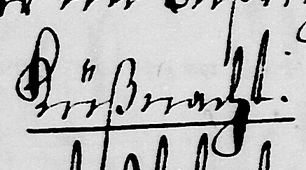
Küßnacht.
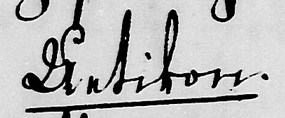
Uetikon.
